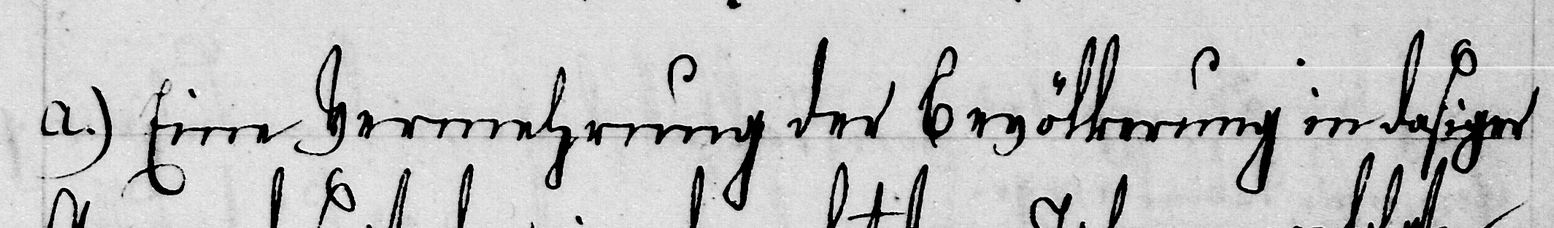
a.) Eine Vermehrung der Bevölkerung in dasiger
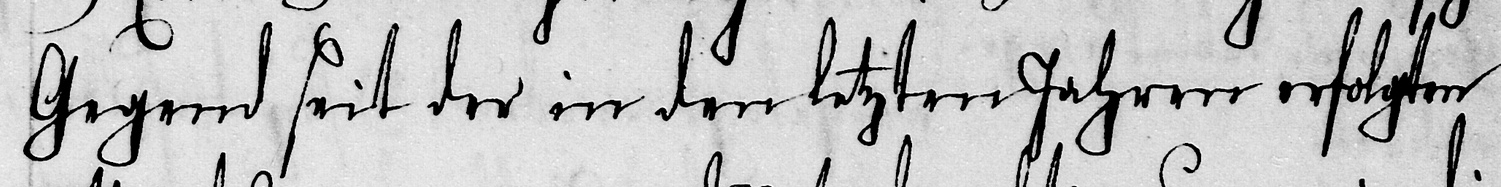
Gegend seit der in den letzten Jahren erfolgten
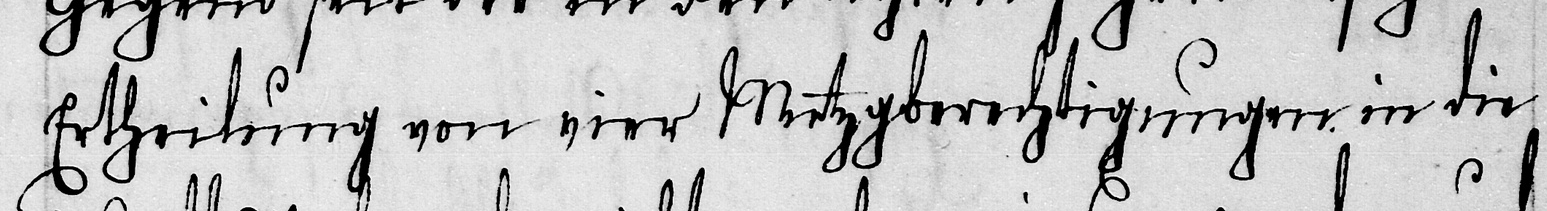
Ertheilung von vier Metzgberechtigungen in die
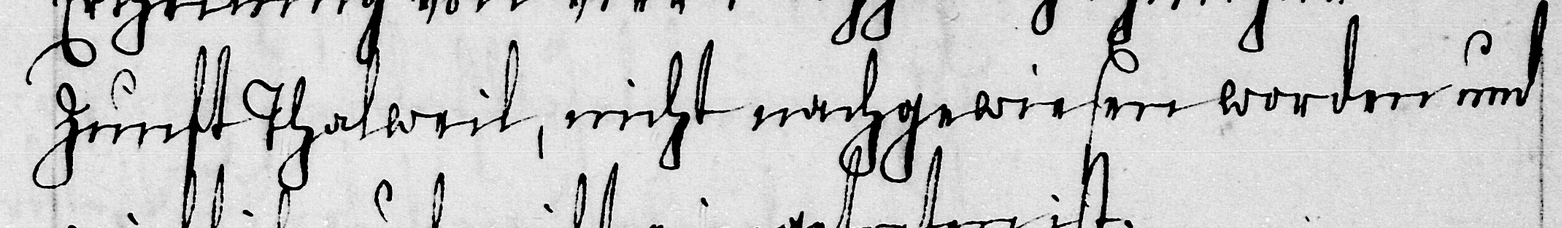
Zunft Thalweil, nicht nachgewiesen worden und
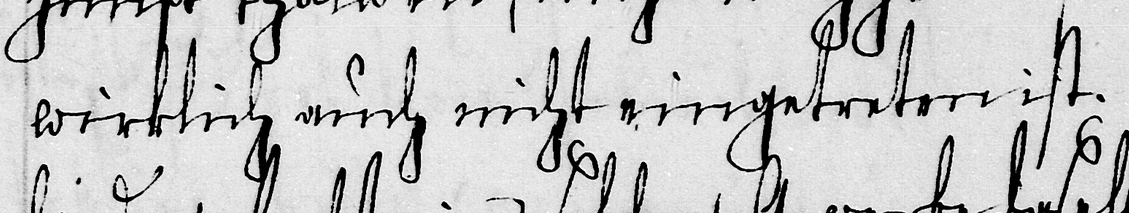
wirklich auch nicht eingetreten ist.
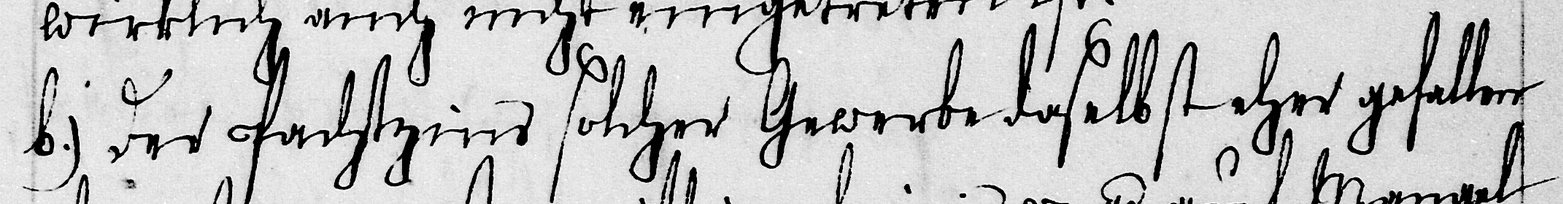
b.) Der Pachtzins solcher Gewerbe daselbst eher gefallen
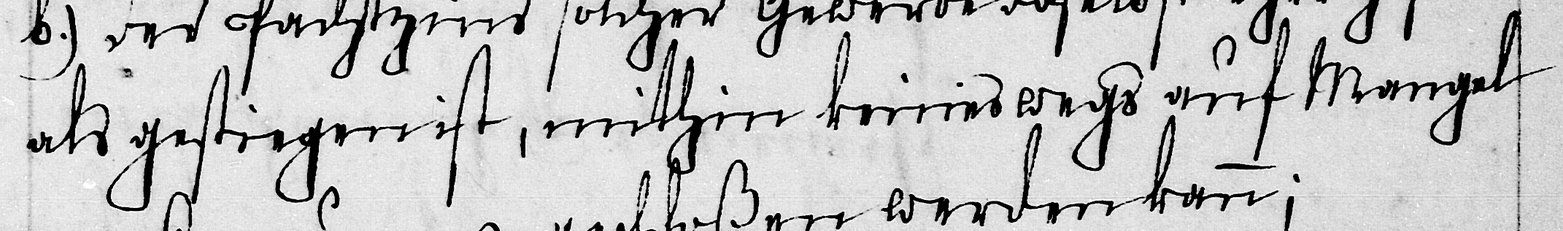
als gestiegen ist, mithin keineswegs auf Mangel
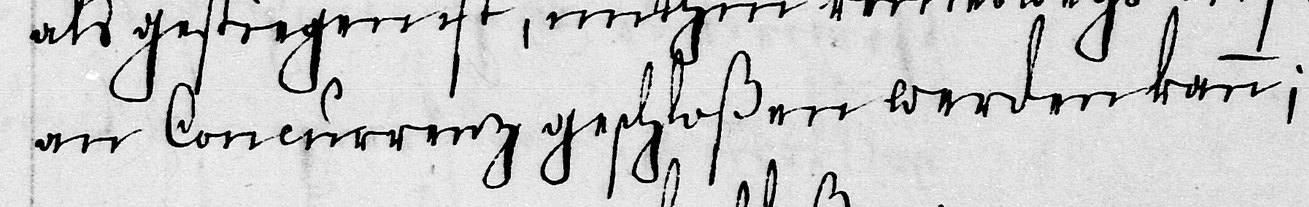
an Concurrenz geschloßen werden kann;
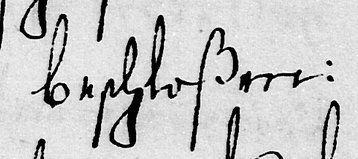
beschloßen:
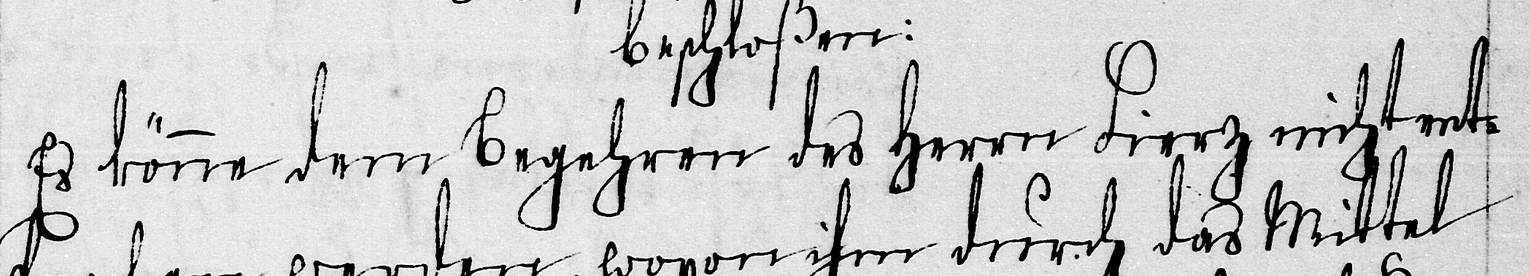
Es könne dem Begehren des Herrn Fierz nicht ent¬
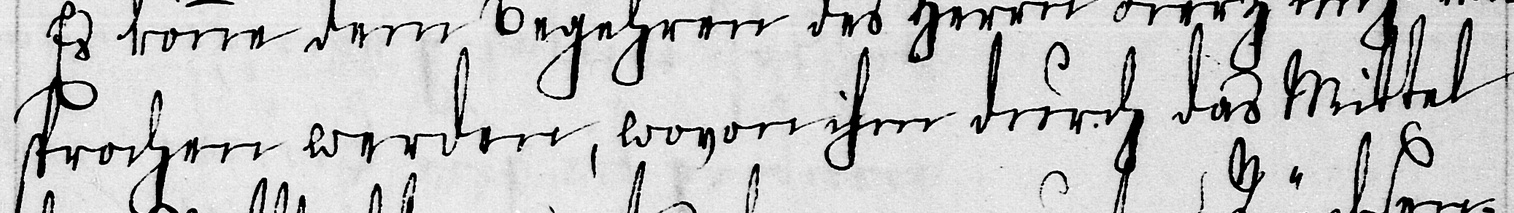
sprochen werden, wovon ihm durch das Mittel
